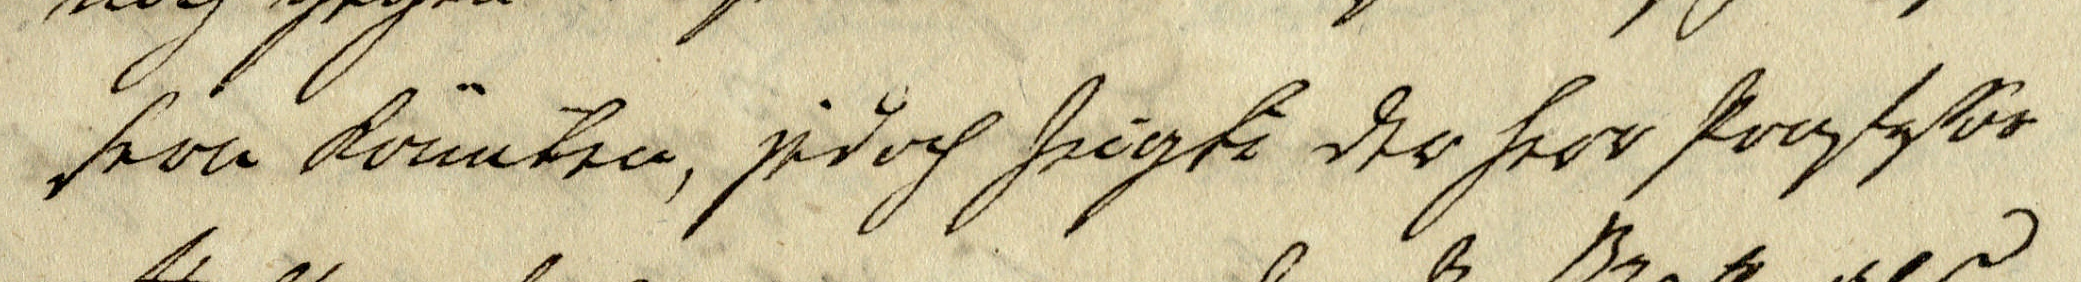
sern könnten, jedoch zeigte der Herr Professor
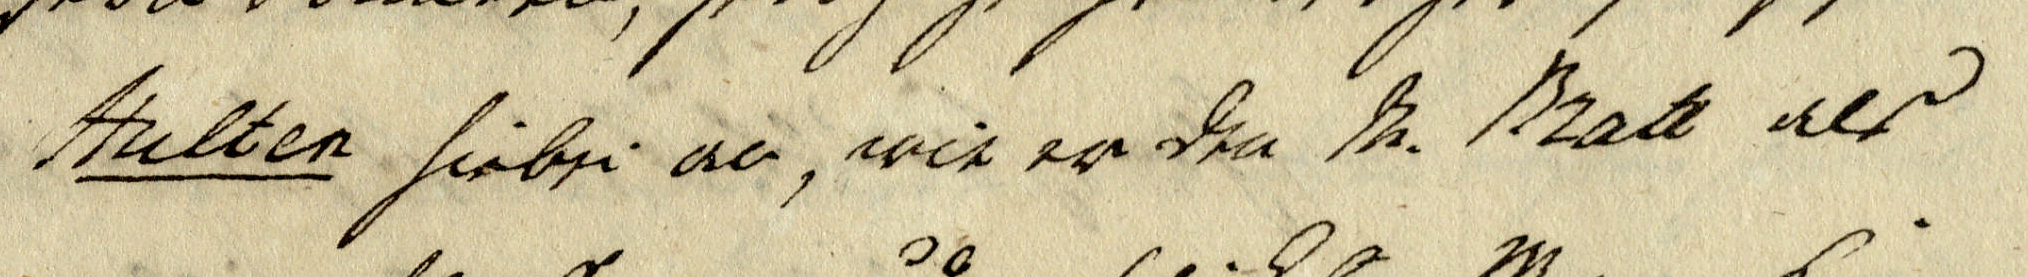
Hultén hiebei an, wie er den M. Bratt als
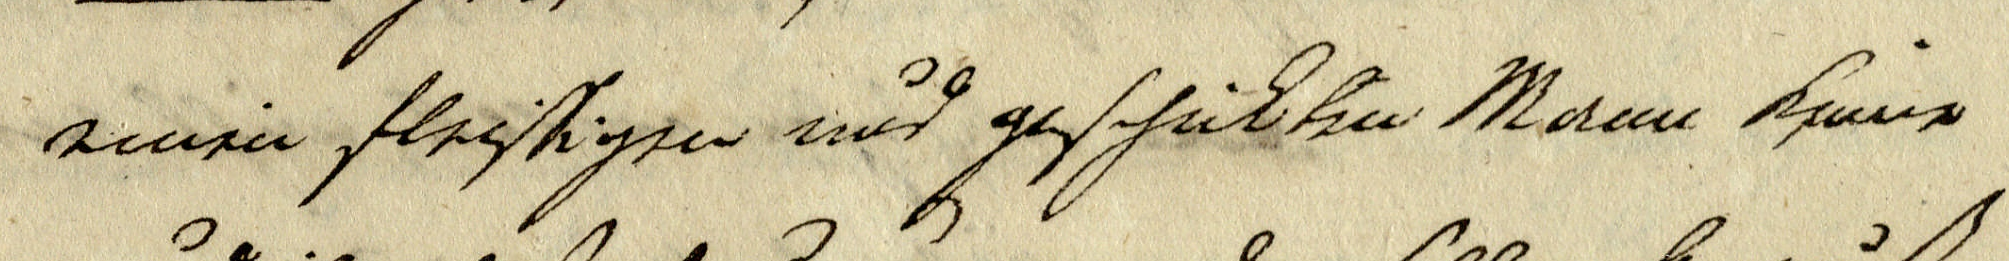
einen fleissigen und geschickten Mann kenne
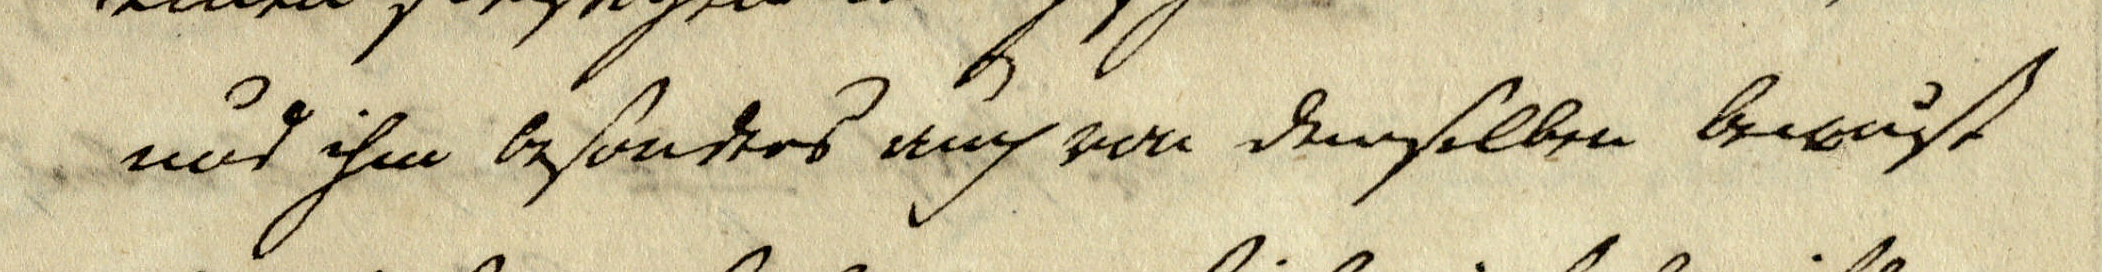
und ihm besonders auch von demselben bewußt
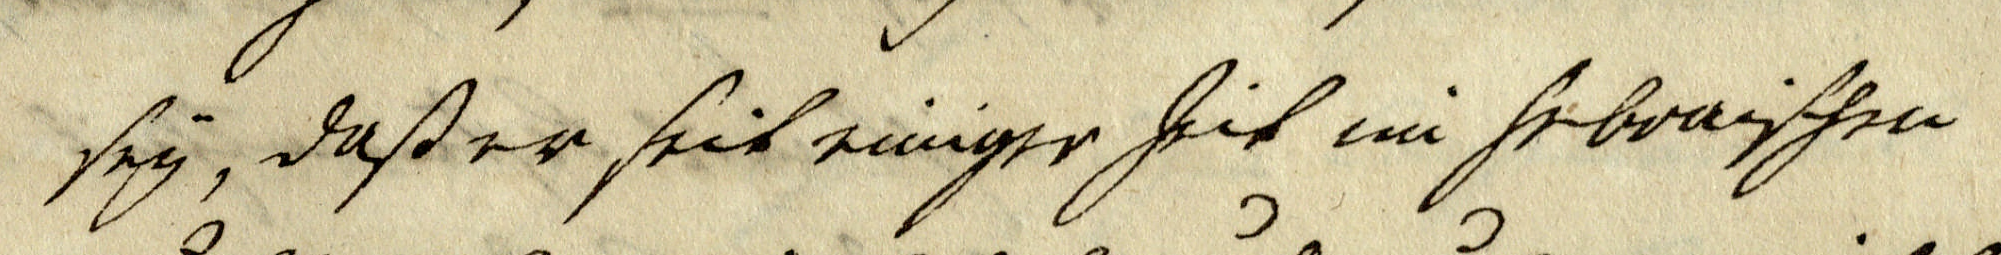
seÿ, daß er seit einiger Zeit im hebraischen
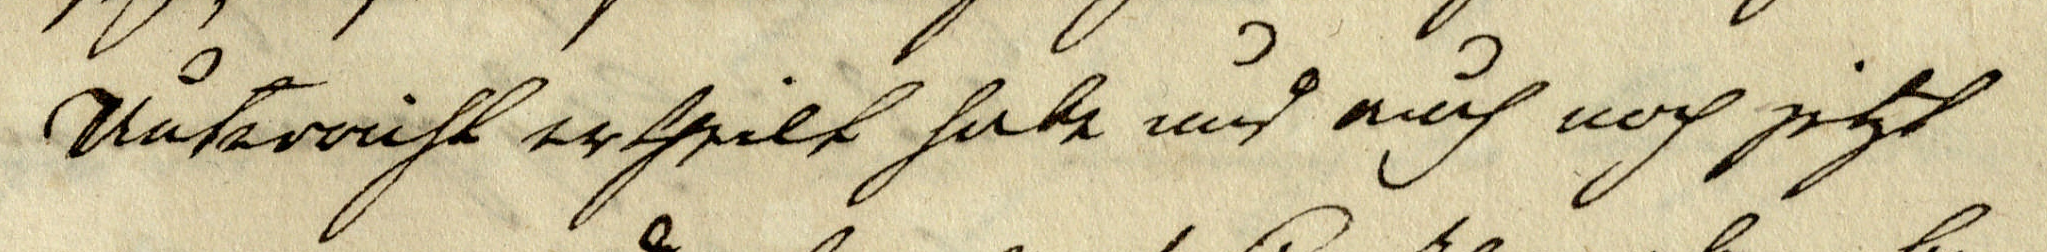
Unterricht ertheilt habe und auch noch jetzt
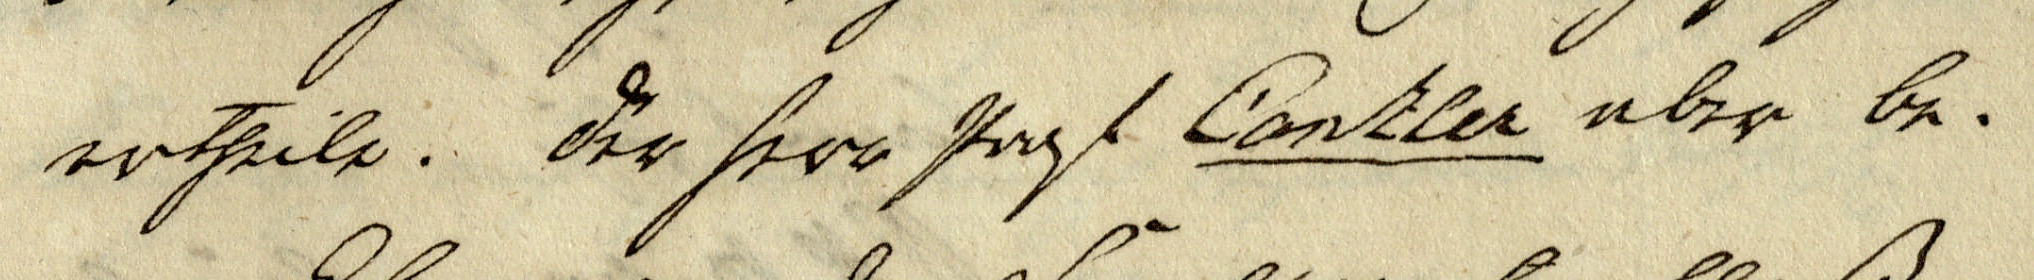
ertheile. Der Herr Prof Canzler aber be¬
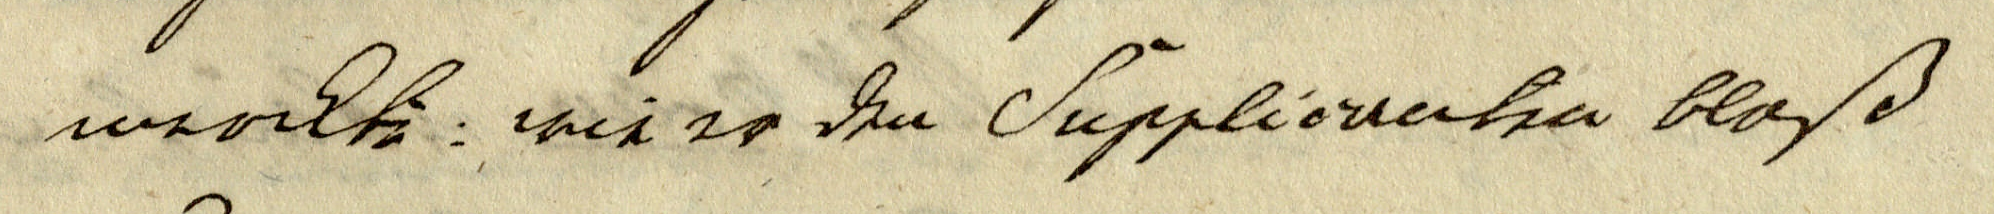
merckte: wie er den Supplicanten bloß
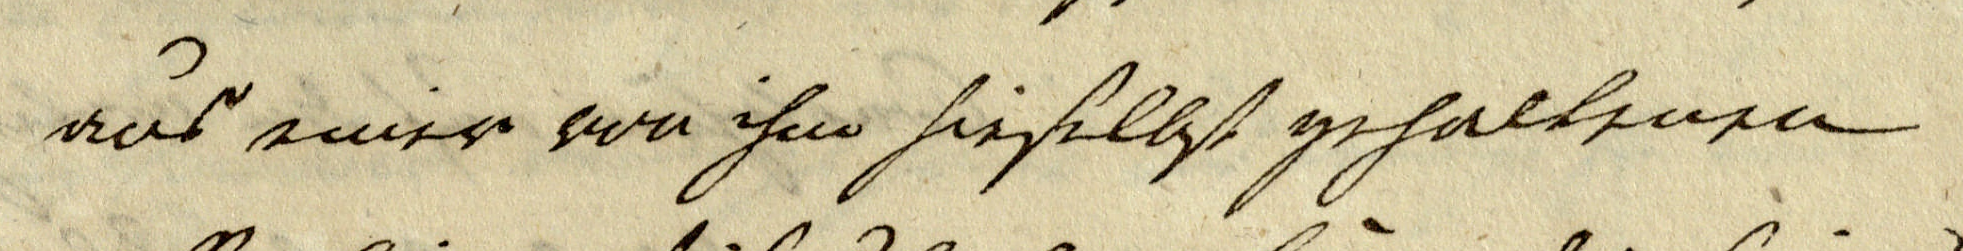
aus einer von ihm hieselbst gehaltenen
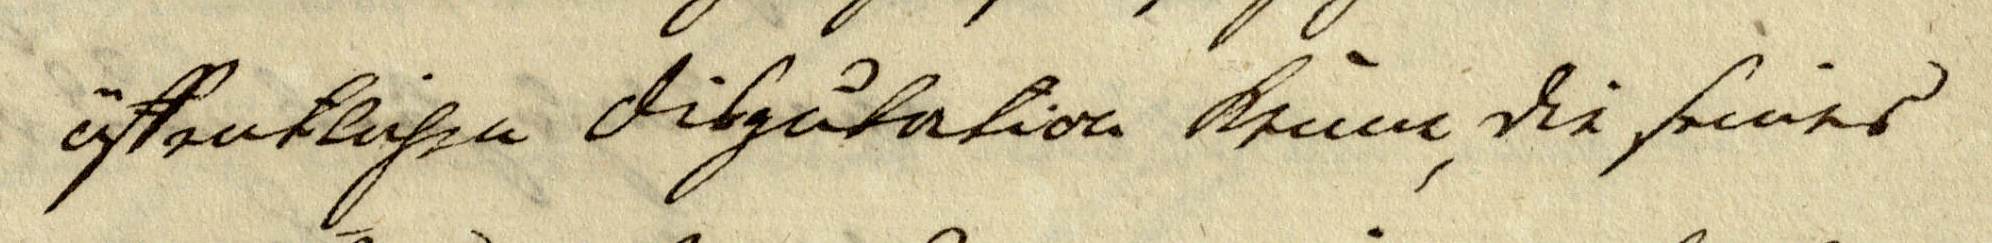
öffentlichen Disputation kenne, die seines
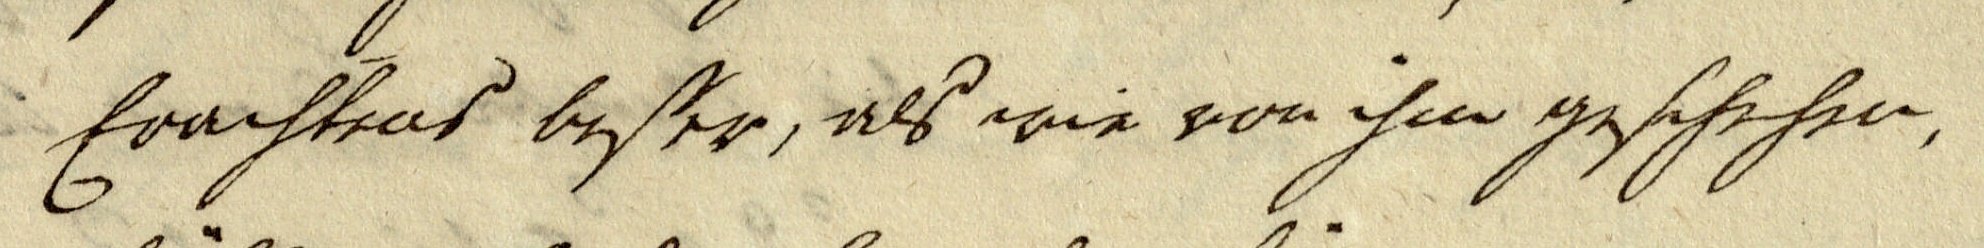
Erachtens besser, als wie von ihm geschehen,
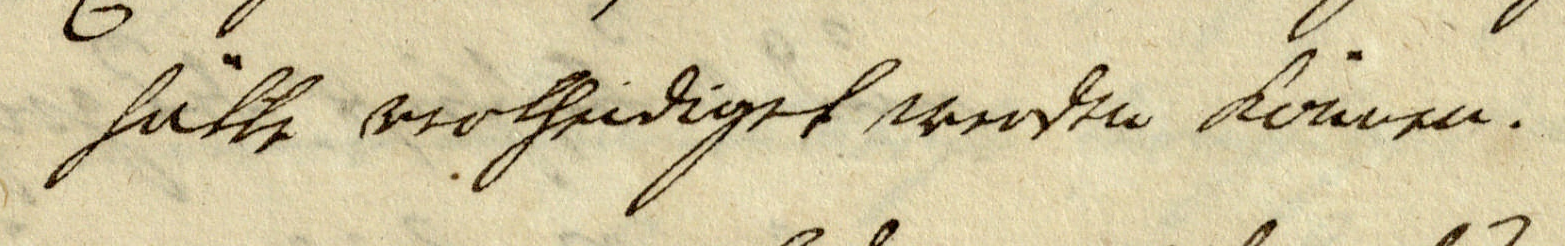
hätte vertheidiget werden können.
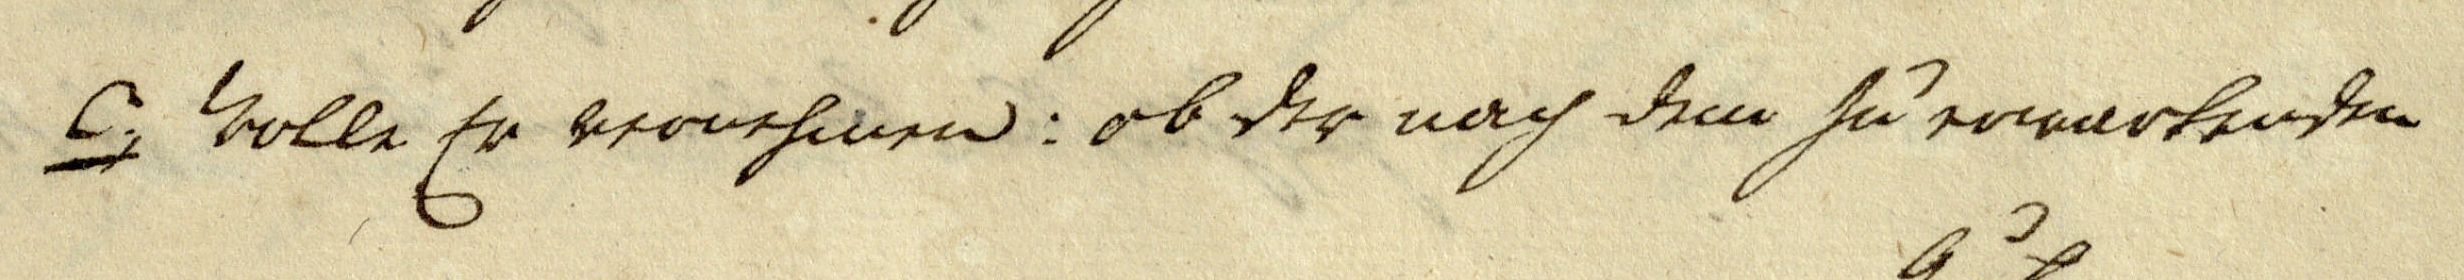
c. Wolle Er vernehmen: ob der nach dem zu erwartenden
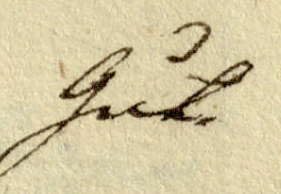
Gut
